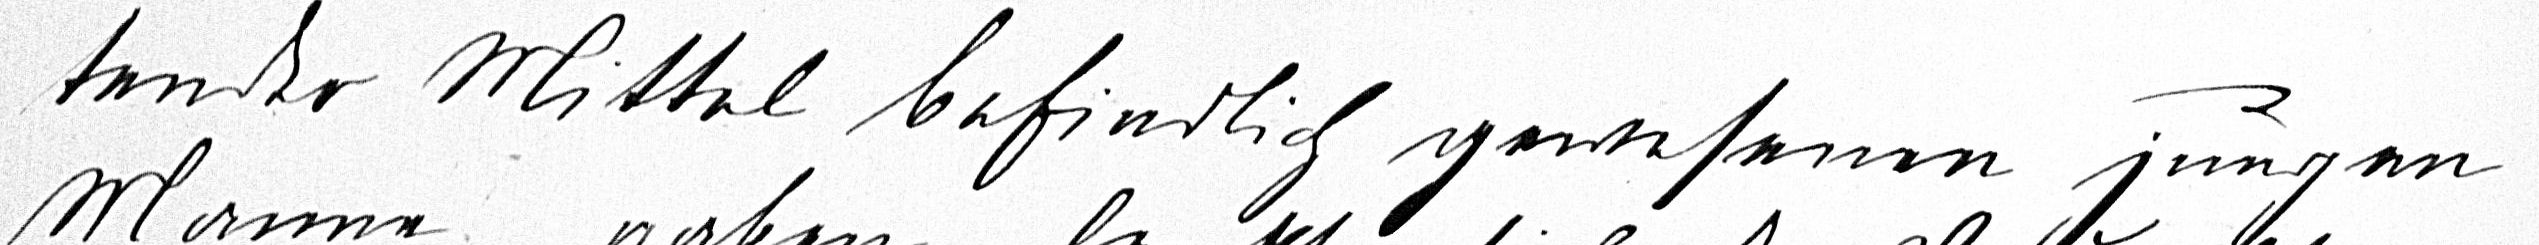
tender Mittel befindlich gewesenen jungen
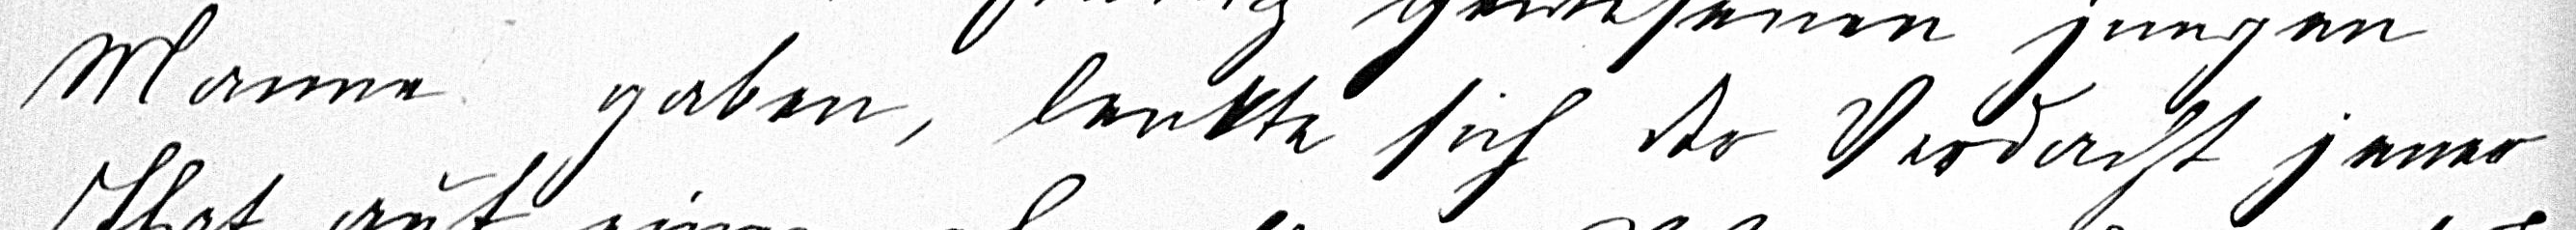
Manne gaben, lenkte sich der Verdacht jener
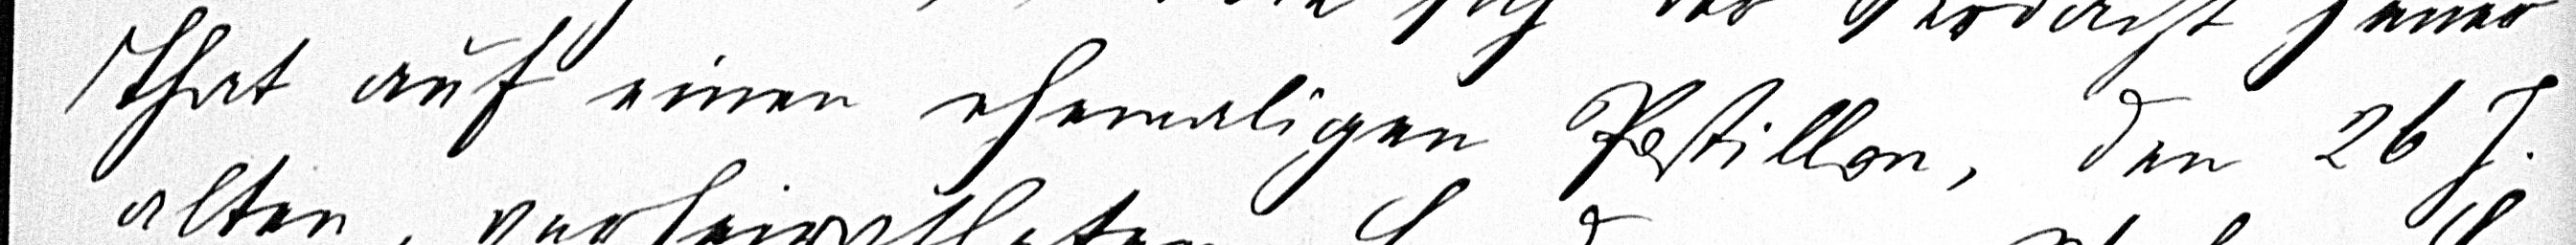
That auf einen ehemaligen Postillon, den 26 J.
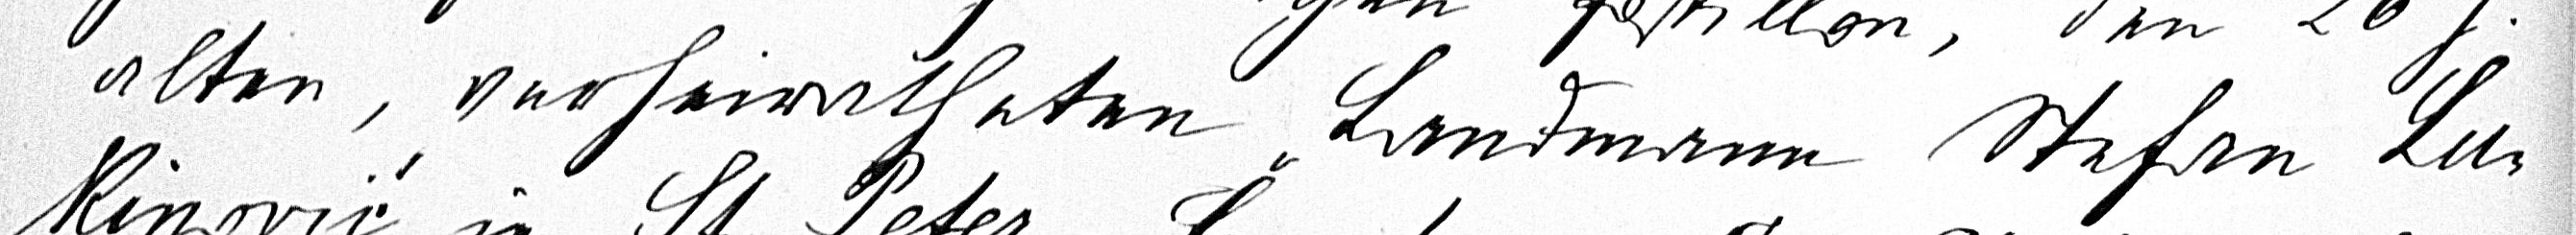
alten, verheiratheten Landmann Stefan Lu¬
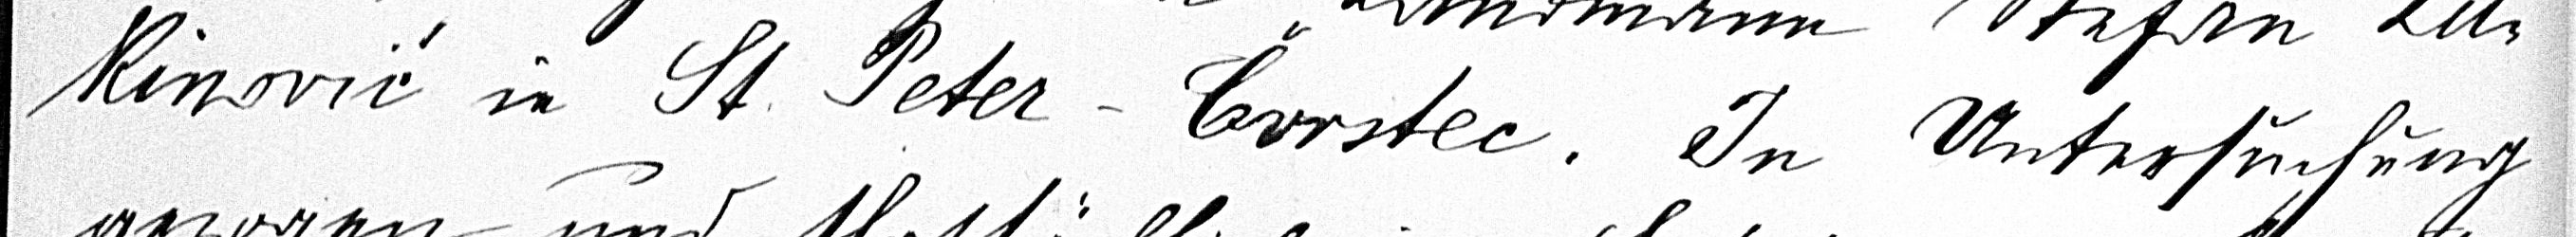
kinović in St. Peter - Čorstec. In Untersuchung
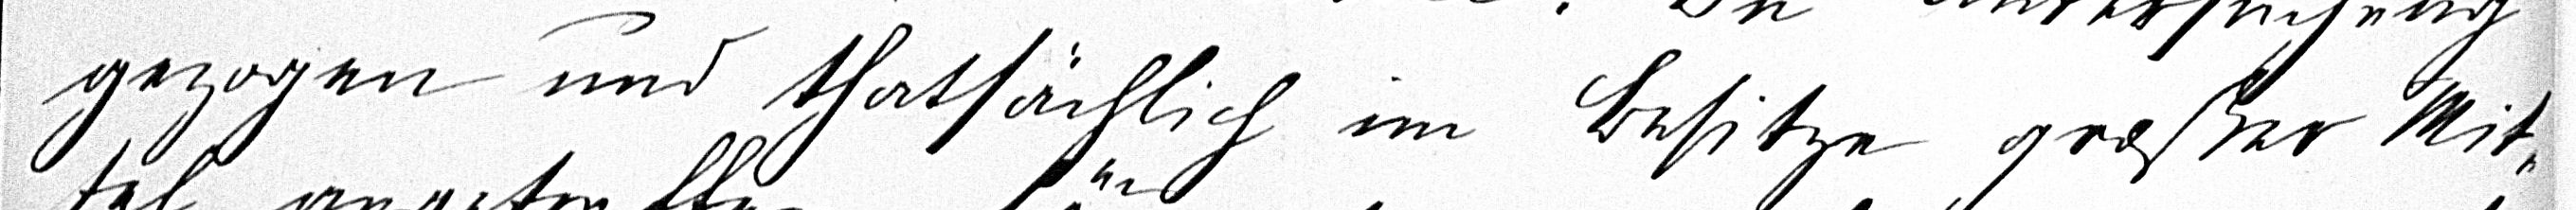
gezogen und thatsächlich im Besitze großer Mit¬
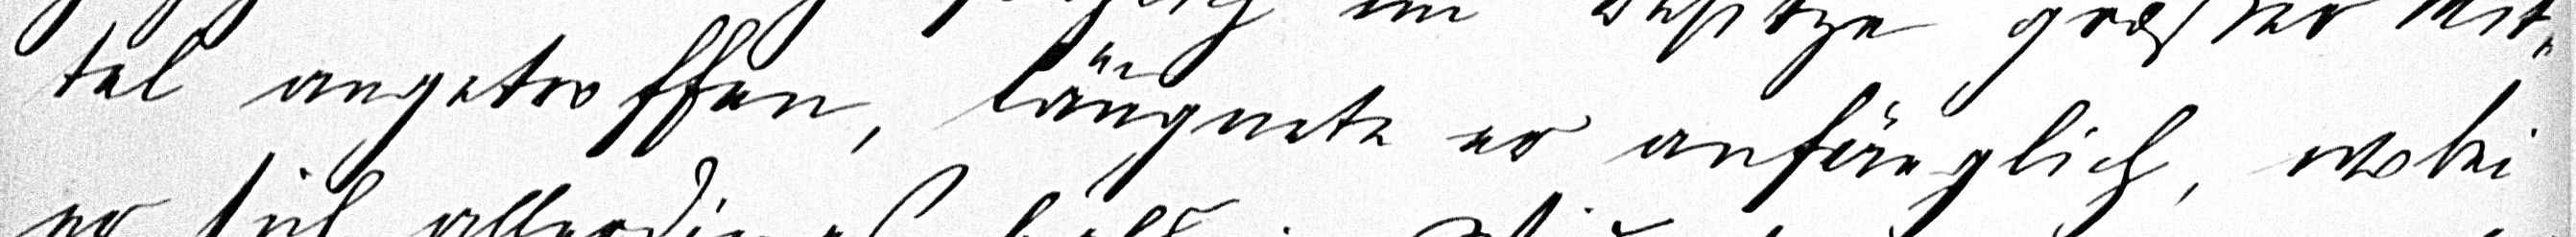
tel angetroffen, läugnete er anfänglich, wobei
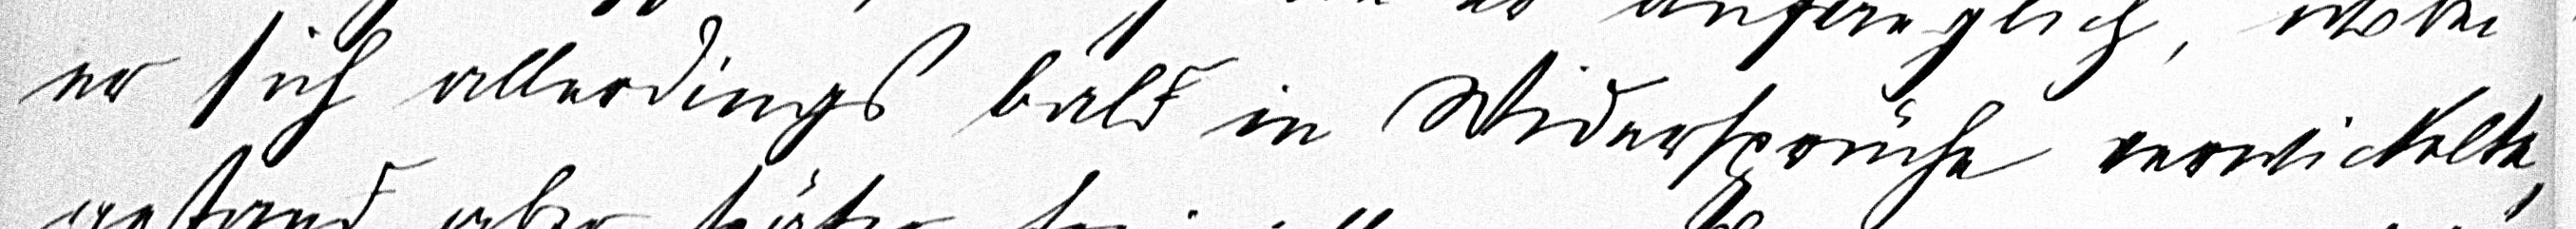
er sich allerdings bald in Widersprüche verwickelte,
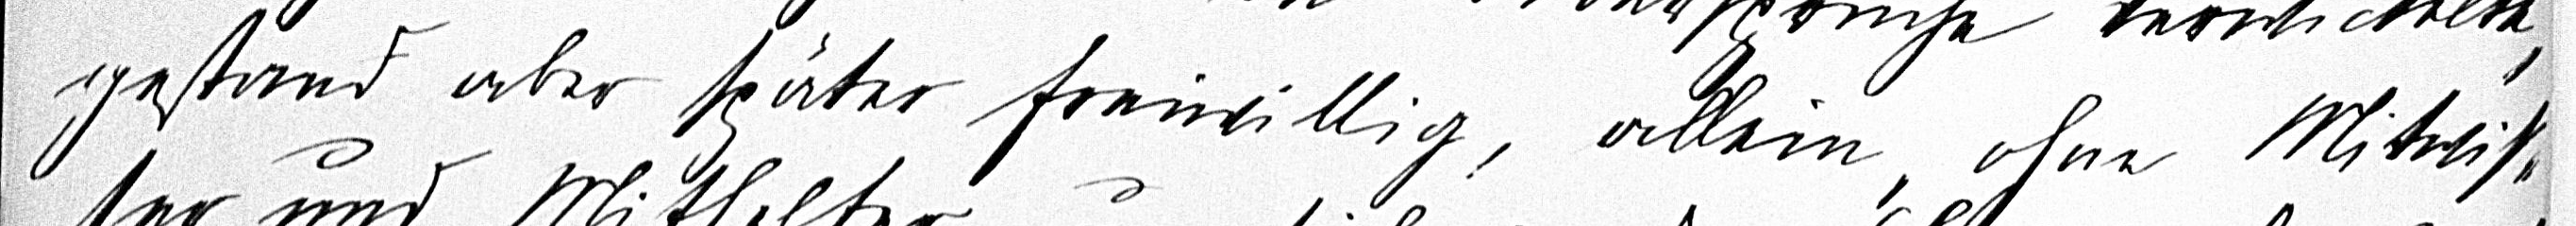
gestand aber später freiwillig, allein, ohne Mitwisser
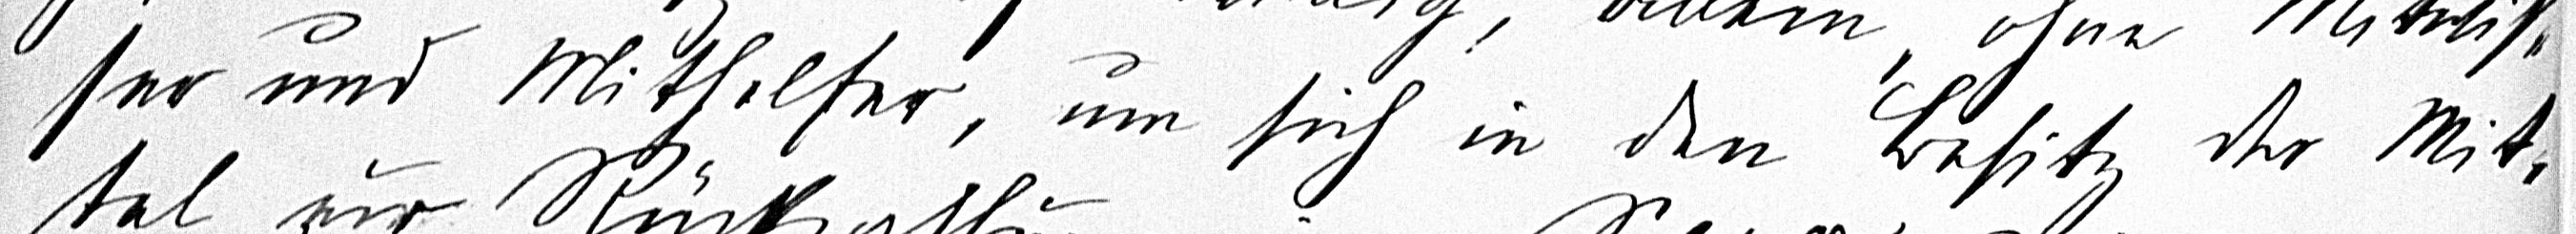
und Mithelfer, um sich in den Besitz der Mit
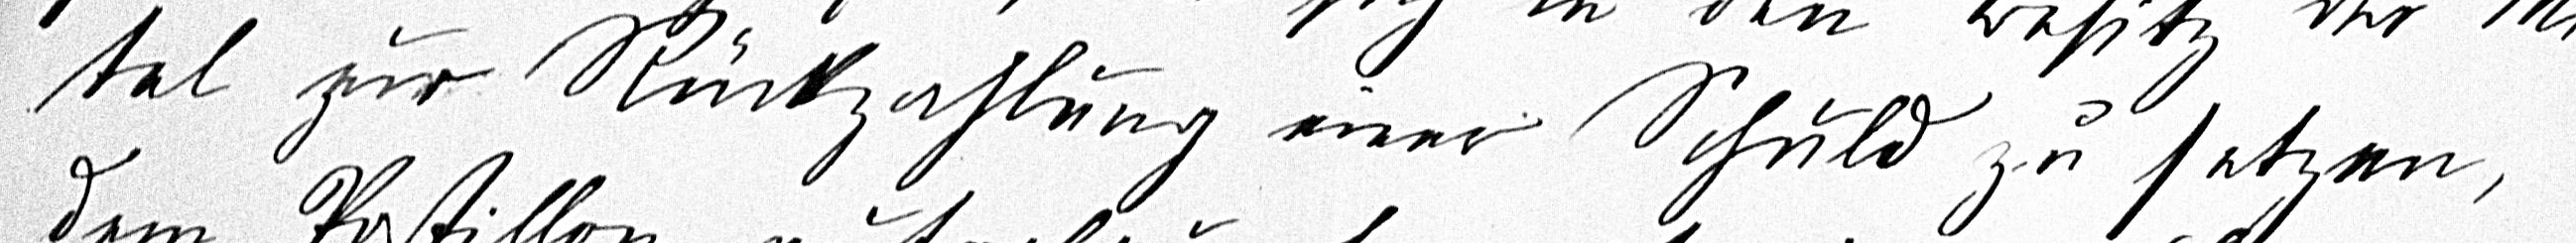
tel zur Rückzahlung einer Schuld zu setzen,
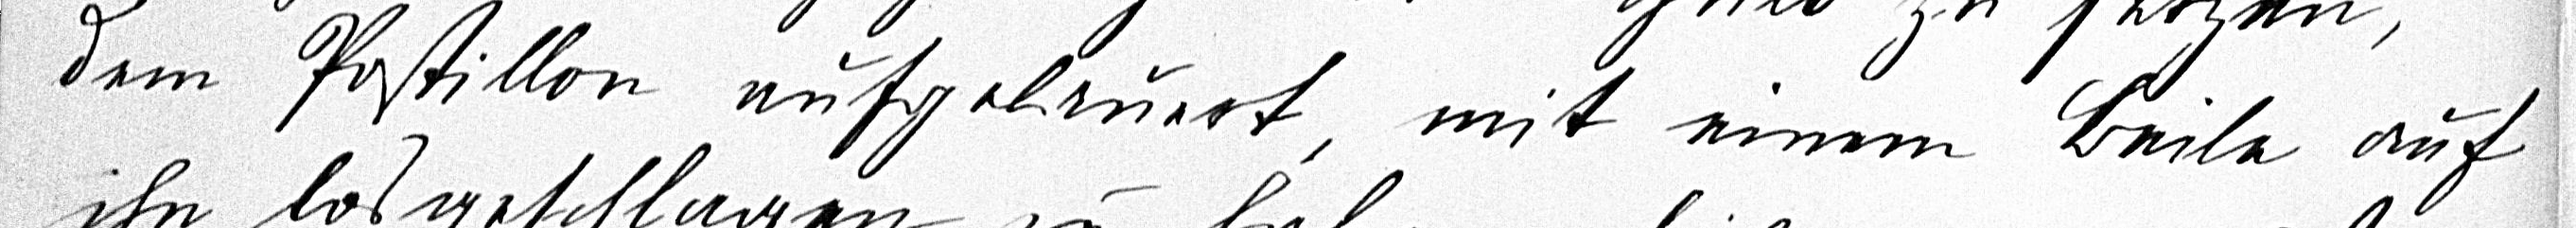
dem Postillon aufgelauert, mit einem Beile auf
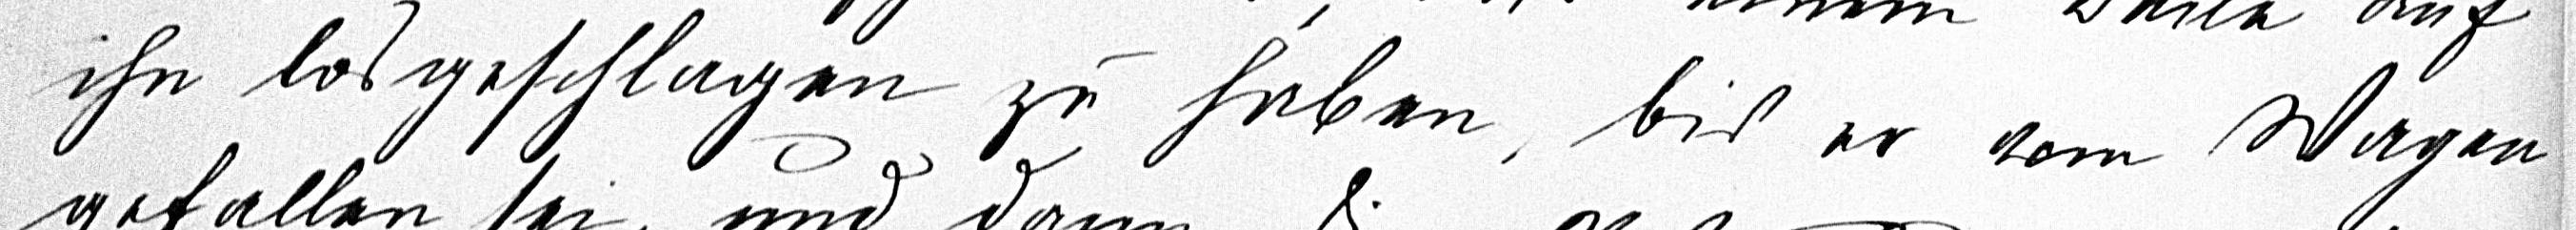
ihn losgeschlagen zu haben, bis er vom Wagen
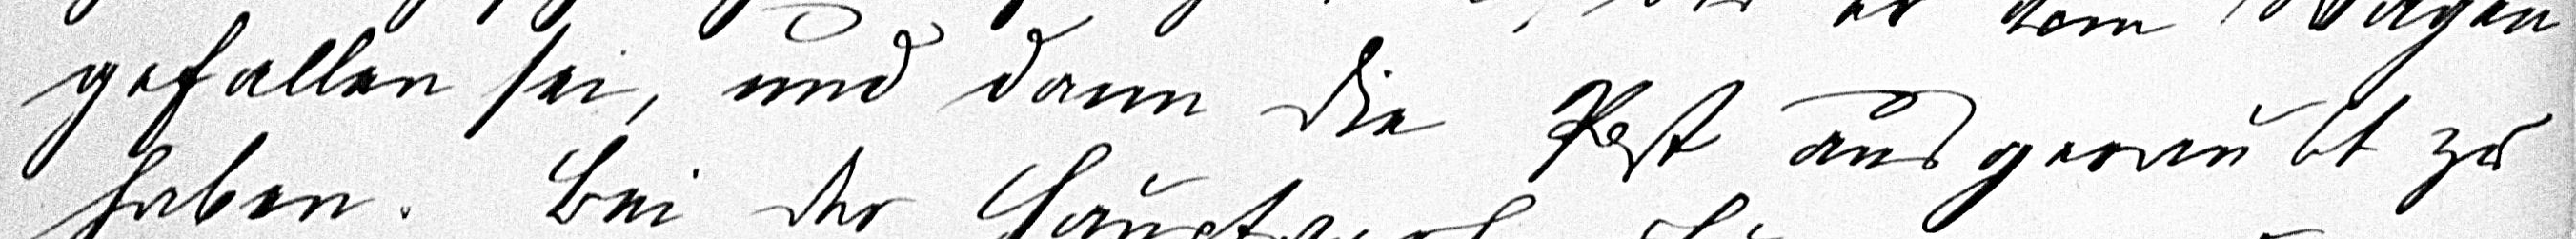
gefallen sei, und dann die Post aus geraubt zu
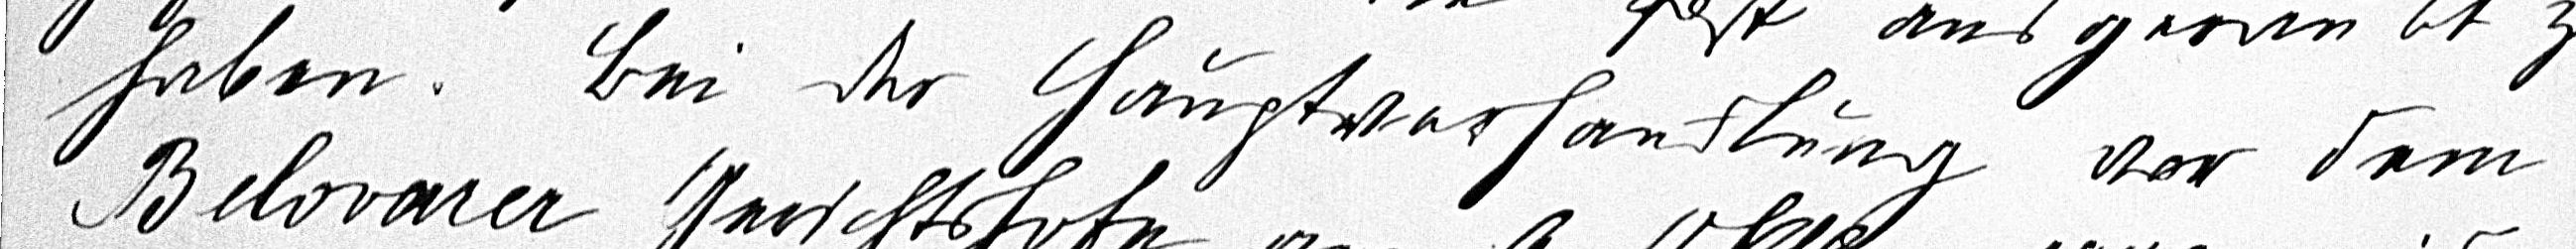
haben. Bei der Hauptverhandlung vor dem
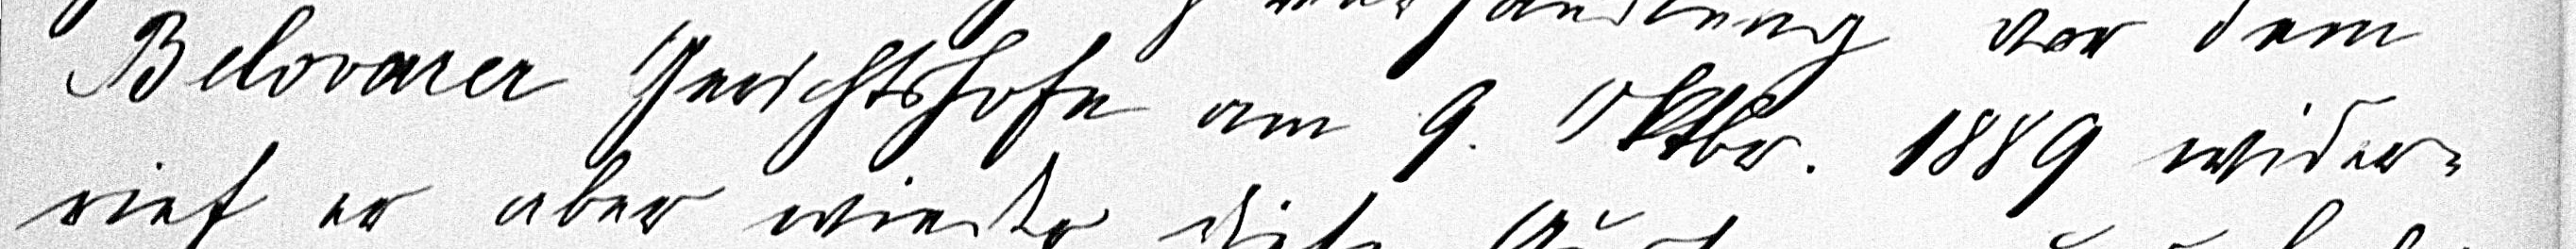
Belovarer Gerichtshofe am 9. Oktbr. 1889 wider¬
